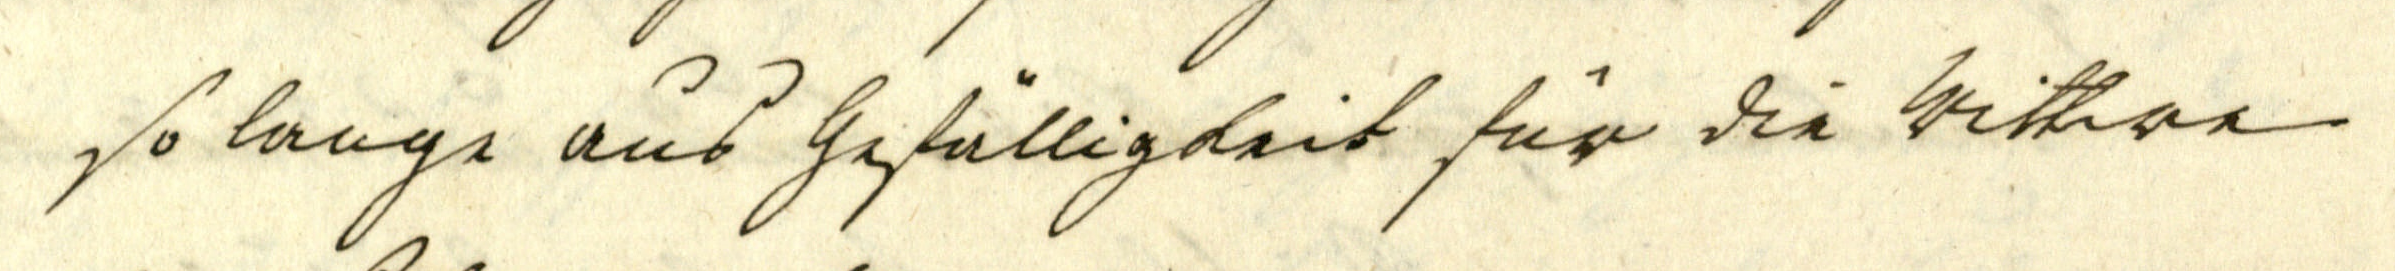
so lange aus Gefälligkeit für die Wittwe
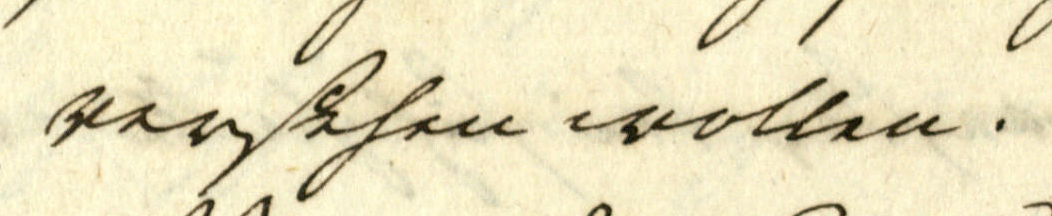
versehen wollen.
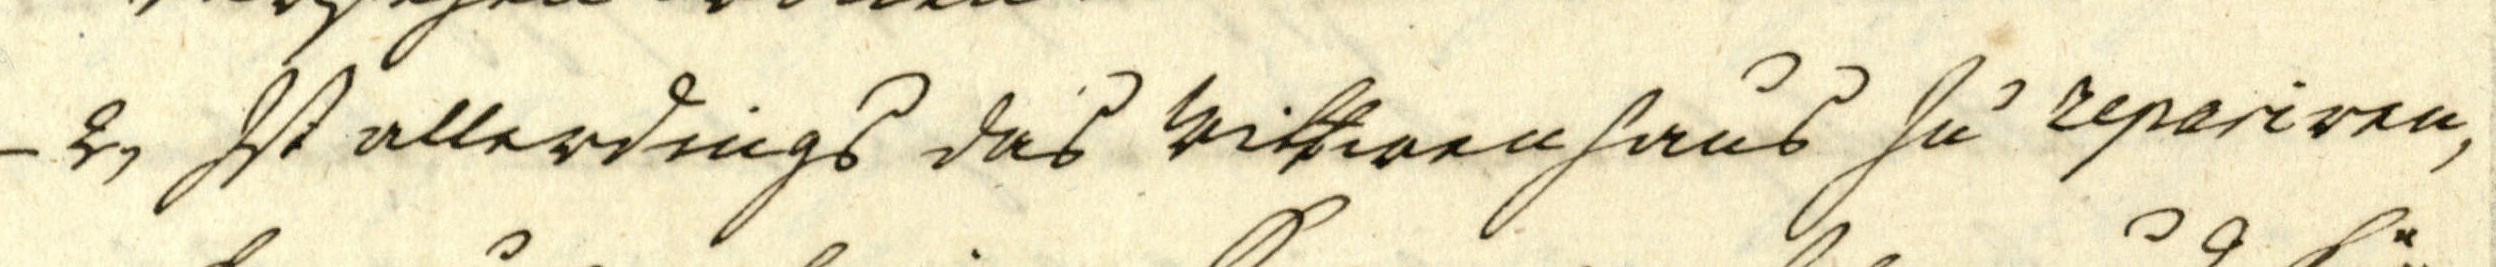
2., Ist allerdings das Wittwenhaus zu repariren,
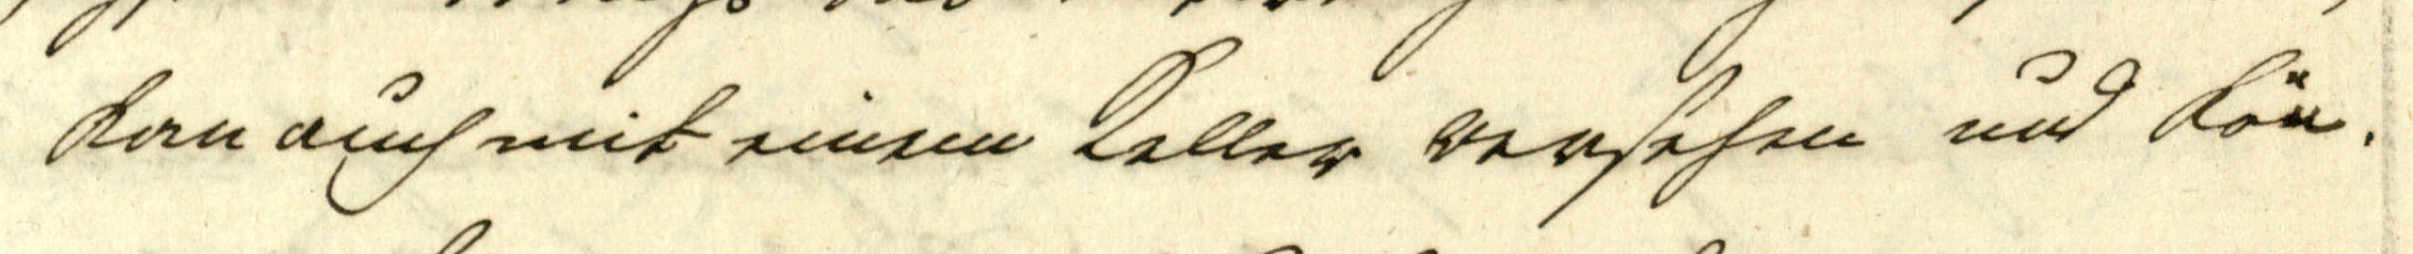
kan auch mit einem Keller versehen und kön¬
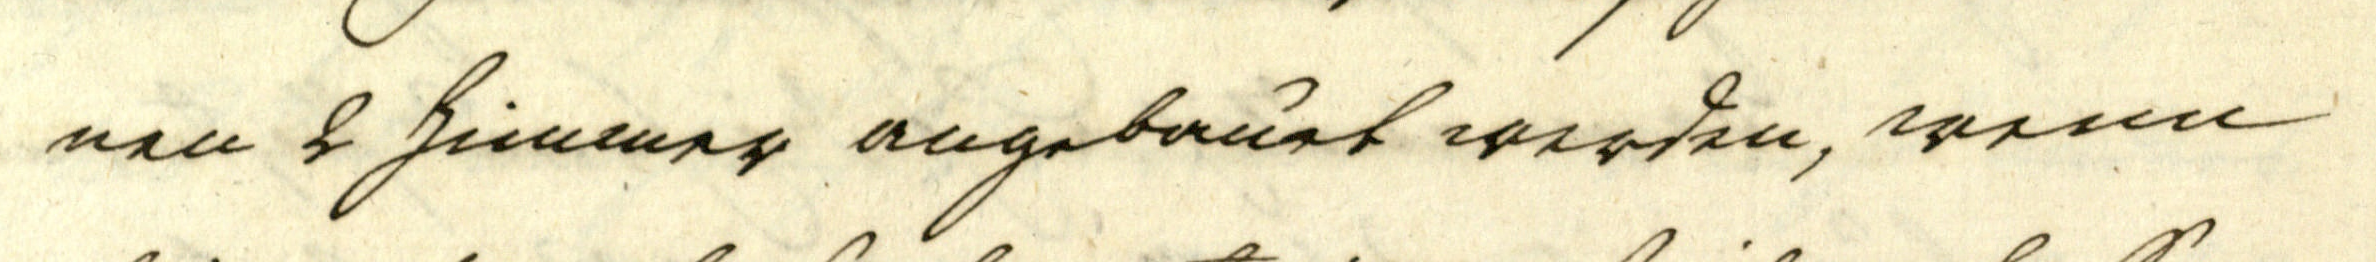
nen 2 Zimmer angebauet werden, wenn
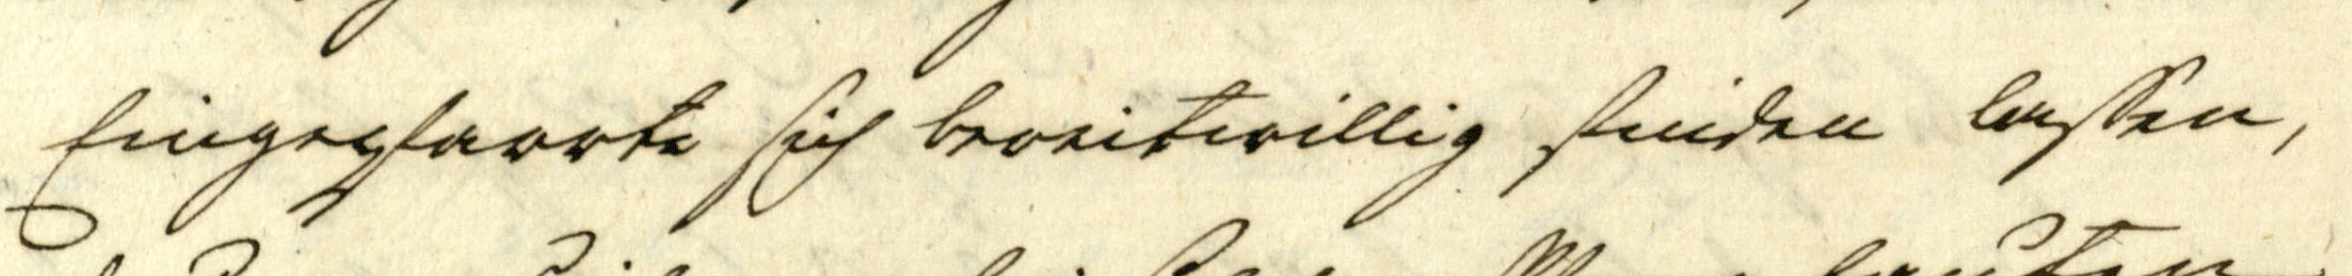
Eingepfarrte sich bereitwillig finden lassen,
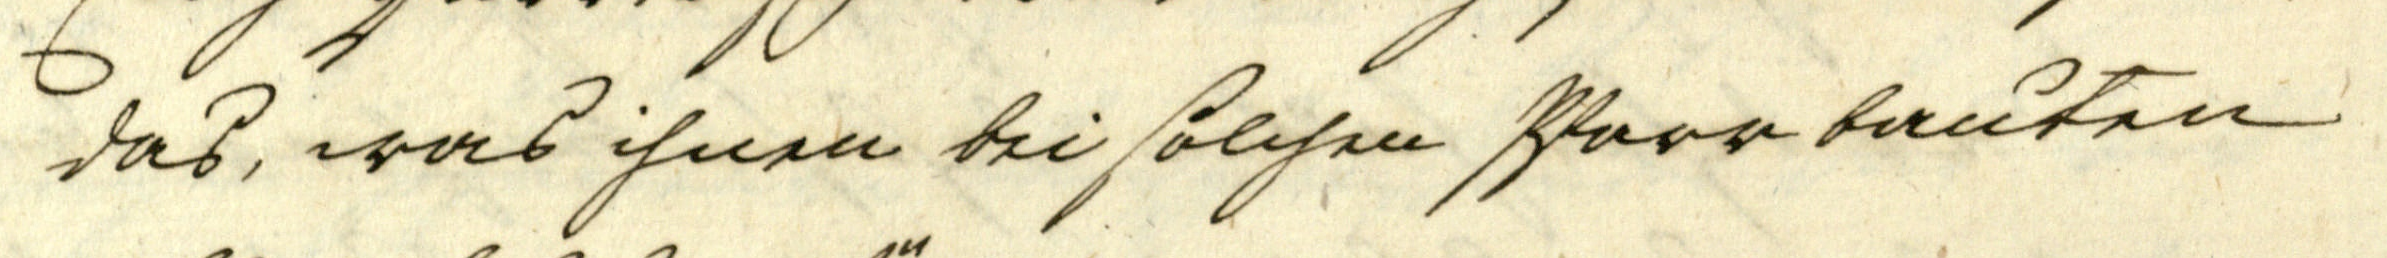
das, was ihnen bei solchen Pfarrbauten
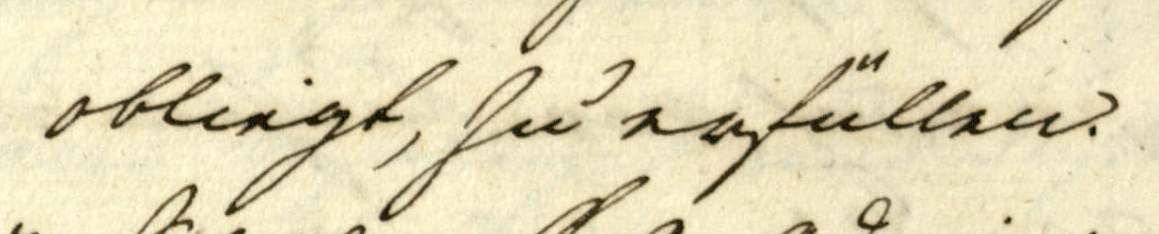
obliegt, zu erfüllen.
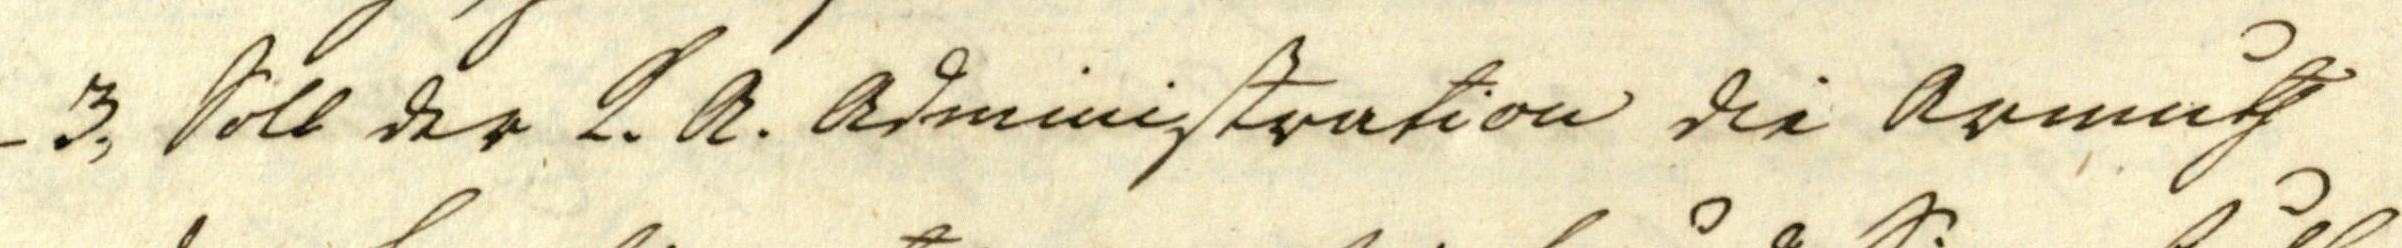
3. Soll der K. A. Administration die Armuth
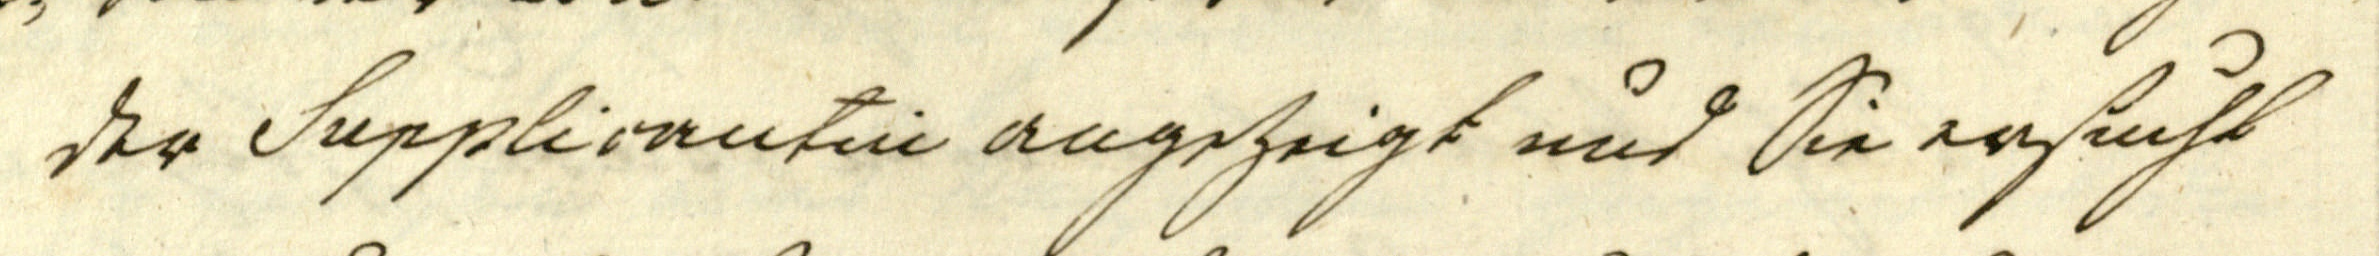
der Supplicantin angezeigt und Sie ersucht
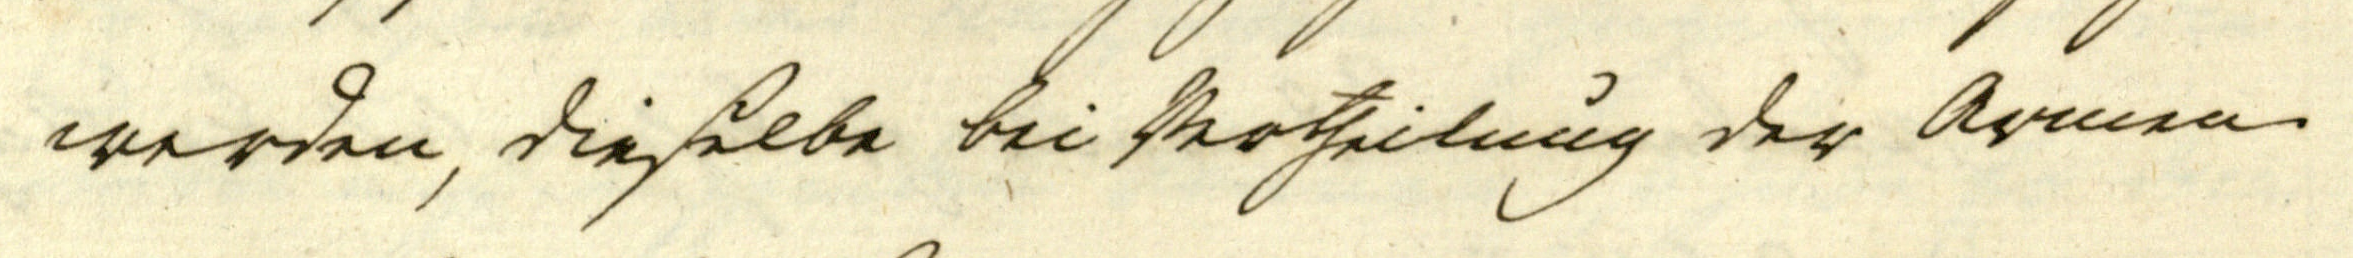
werden, dieselbe bei Vertheilung der Armen¬
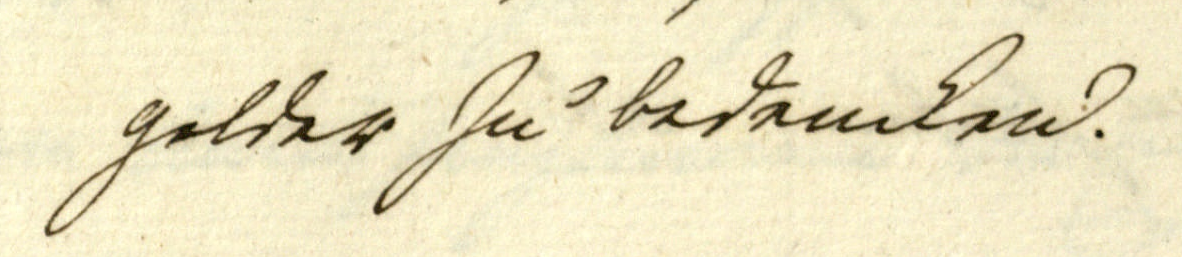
gelder zu bedencken.
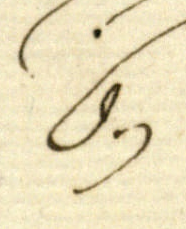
6.
